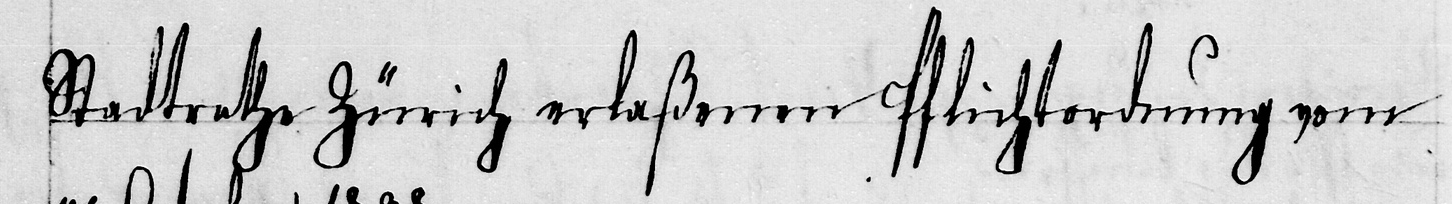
Stadtrathe Zürich erlaßenen Pflichtordnung vom
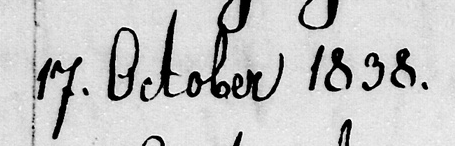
17. October 1838.
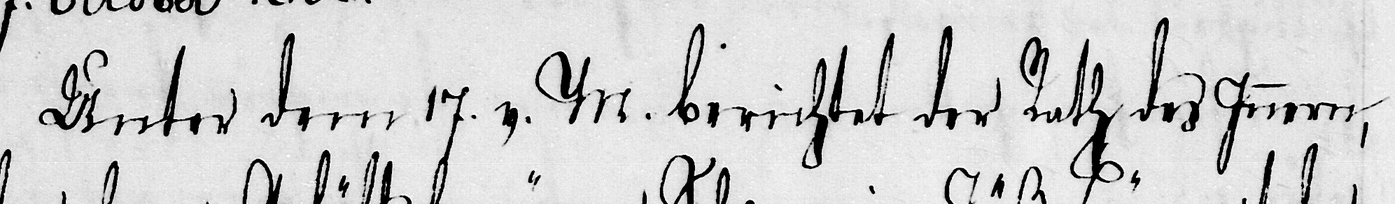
Unter dem 17. v. M. berichtet der Rath des Innern,
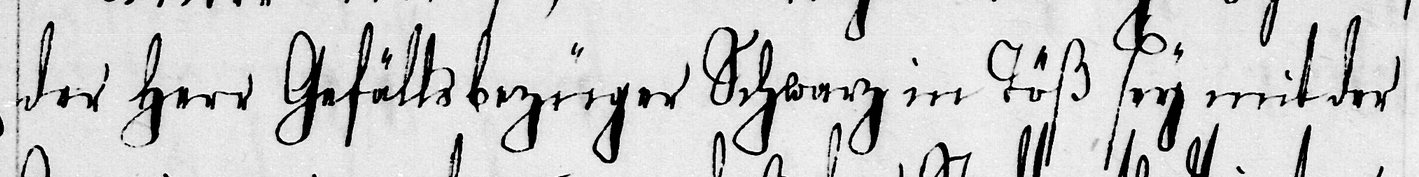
der Herr Gefällsbezüger Schwarz in Töß sey mit der
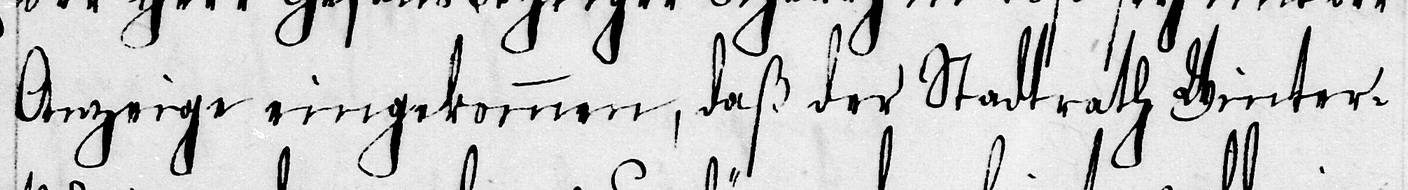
Anzeige eingekommen, daß der Stadtrath Winter¬
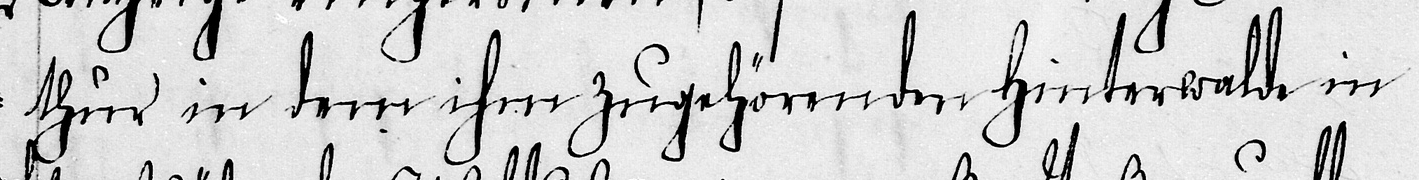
thur in dem ihm zugehörenden Hinterwalde in
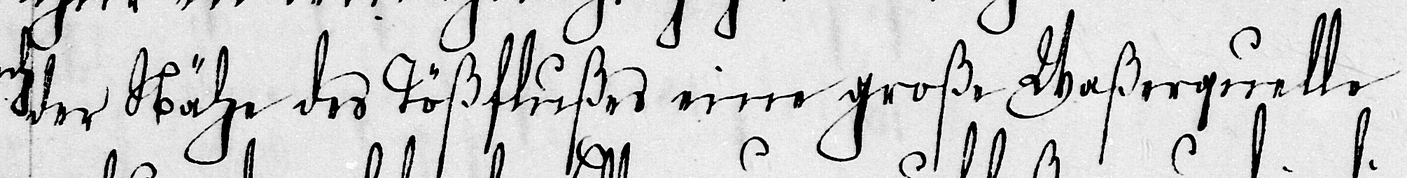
der Nähe des Tößflußes eine große Waßerquelle
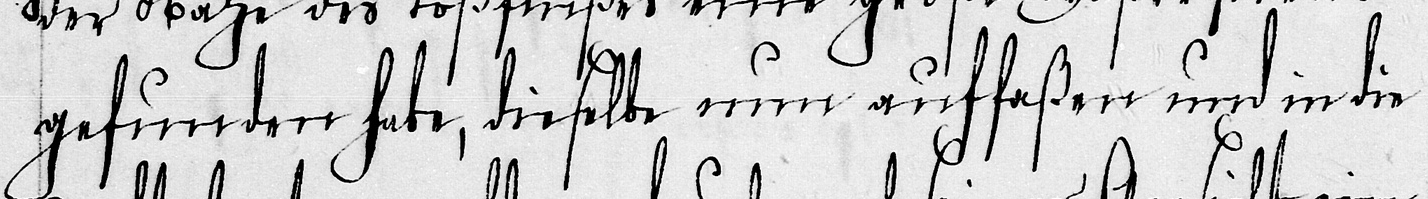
gefunden habe, dieselbe nun auffaßen und in die
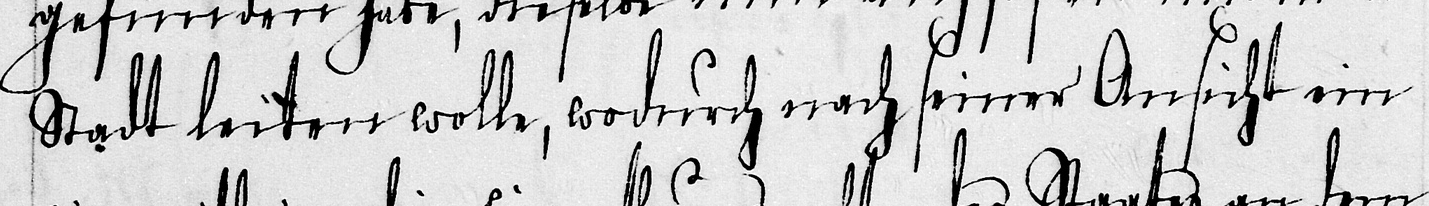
Stadt leiten wolle, wodurch nach seiner Ansicht ein
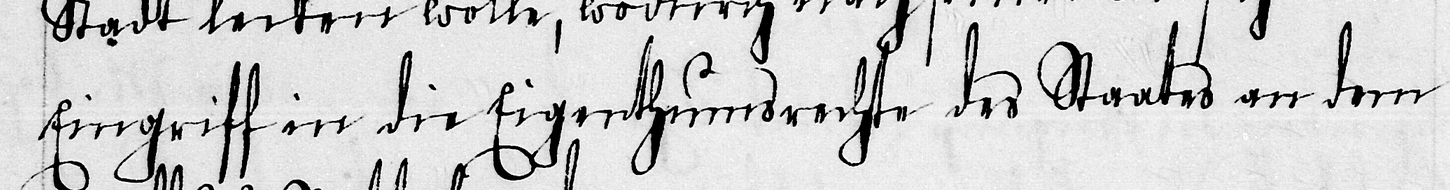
Eingriff in die Eigenthumsrechte des Staates an dem
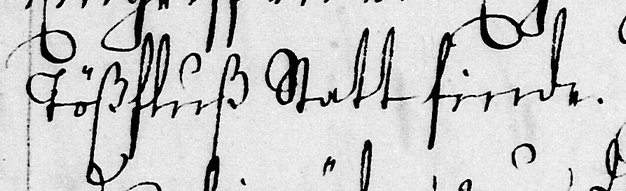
Tößfluß Statt finde.
